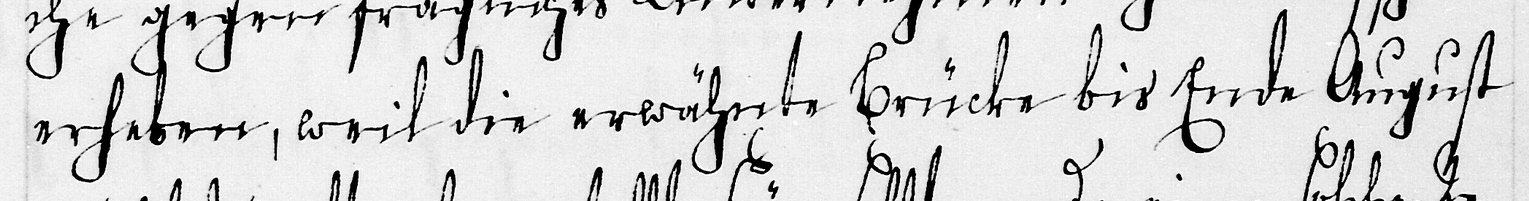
erheben, weil die erwähnte Brücke bis Ende August
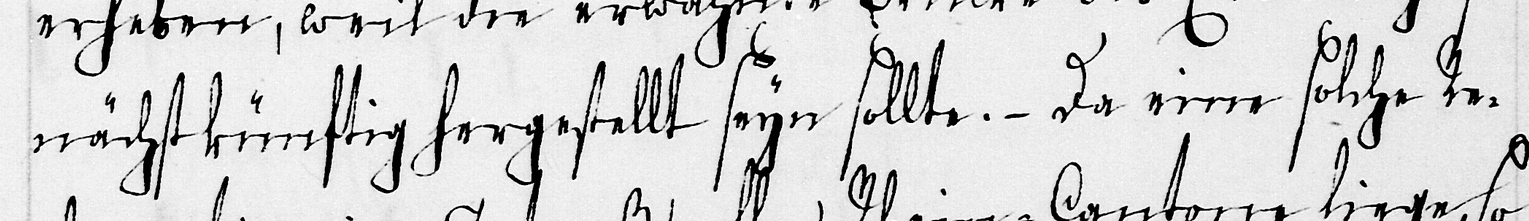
nächstkünftig hergestellt seyn sollte. – Da eine solche Re¬
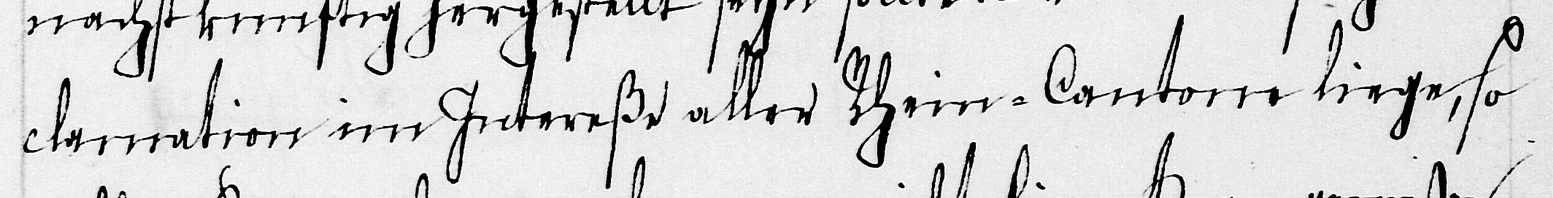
clamation im Intereße aller Rhein-Cantone liege, so
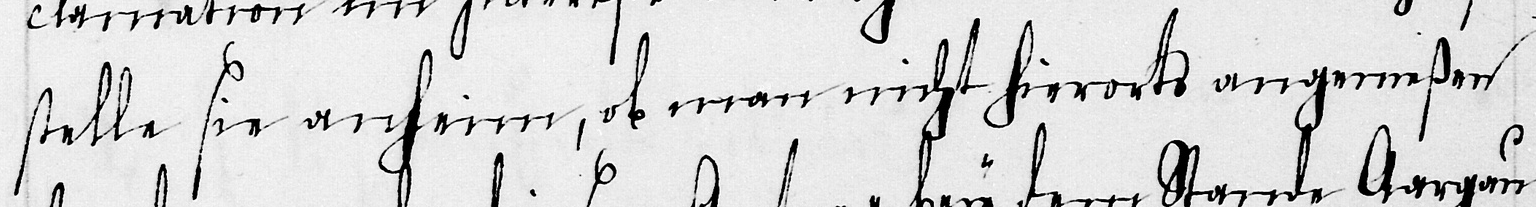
stelle sie anheim, ob man nicht hierorts angemeßen
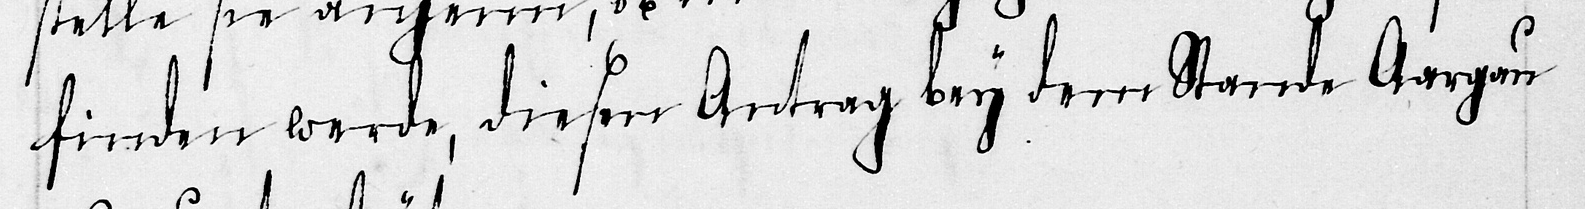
finden werde, diesen Antrag bey dem Stande Aargau
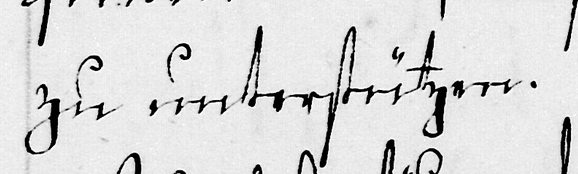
zu unterstützen.
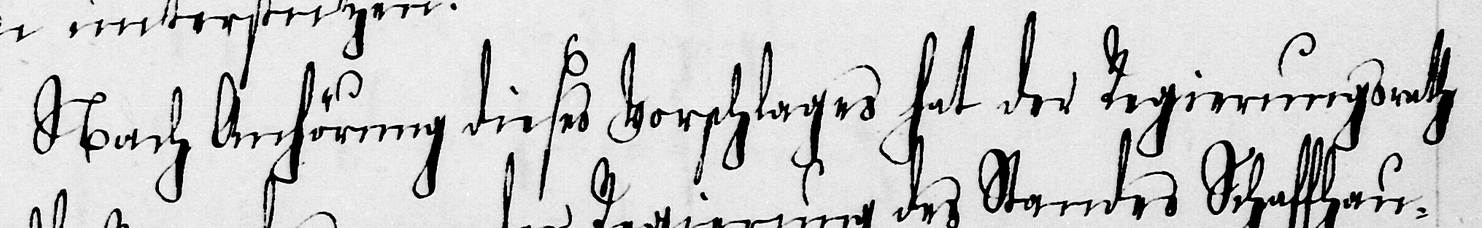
Nach Anhörung dieses Vorschlages hat der Regierungsrath
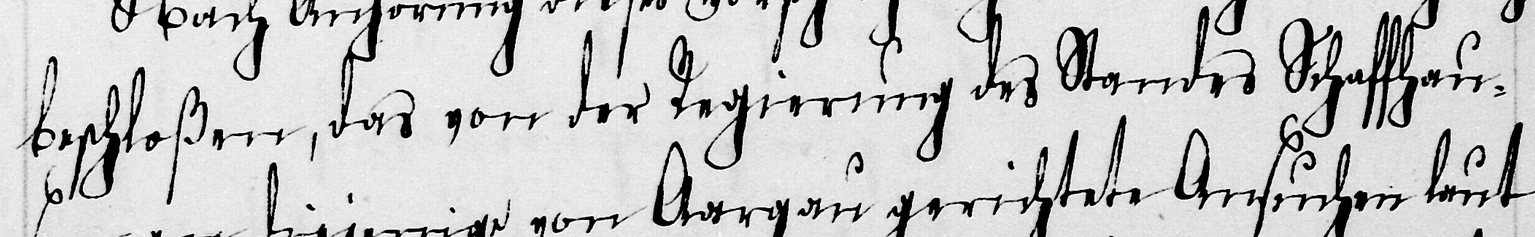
beschloßen, das von der Regierung des Standes Schaffhau¬
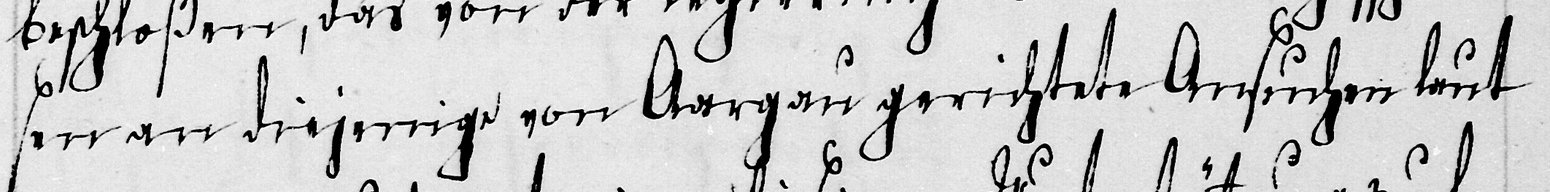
sen an diejenige von Aargau gerichtete Ansuchen laut
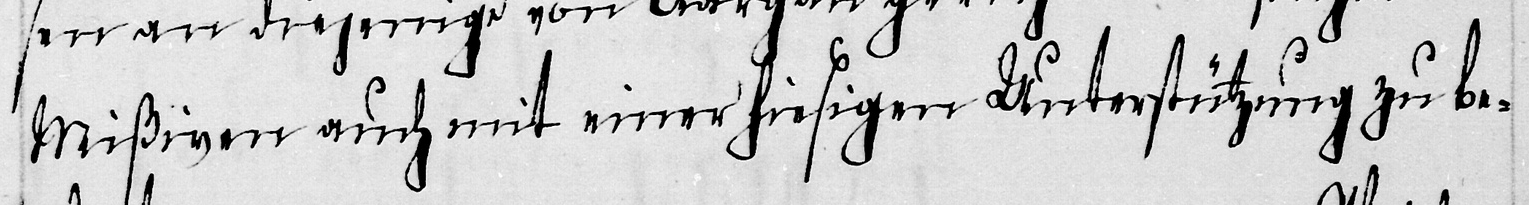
Mißiven auch mit einer hiesigen Unterstützung zu be¬
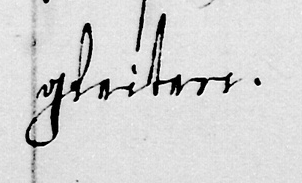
gleiten.
